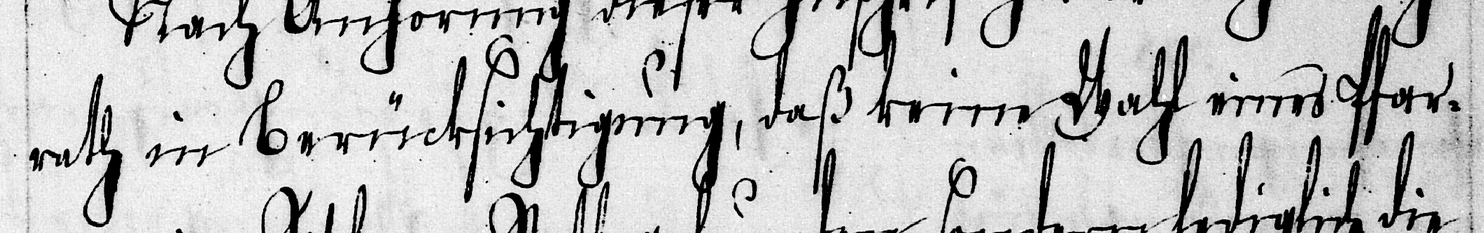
rath in Berücksichtigung, daß keine Wahl eines Pfar¬
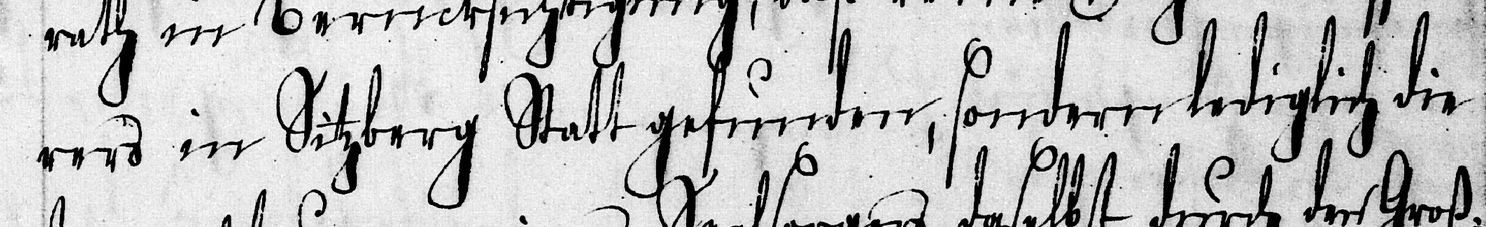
rers in Sitzberg Statt gefunden, sondern lediglich die
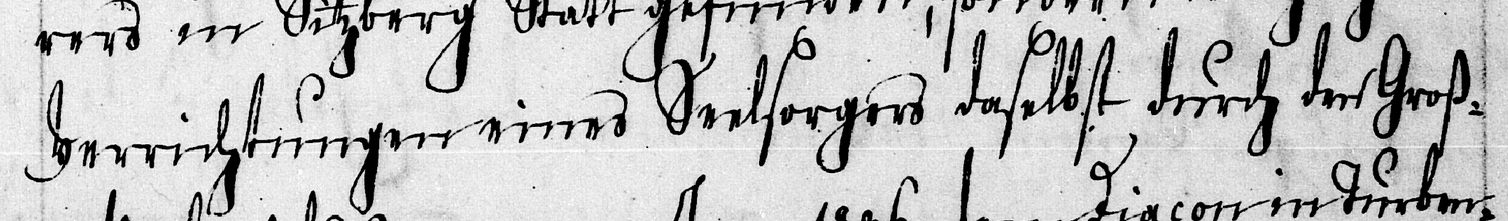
Verrichtungen eines Seelsorgers daselbst durch den Groß¬
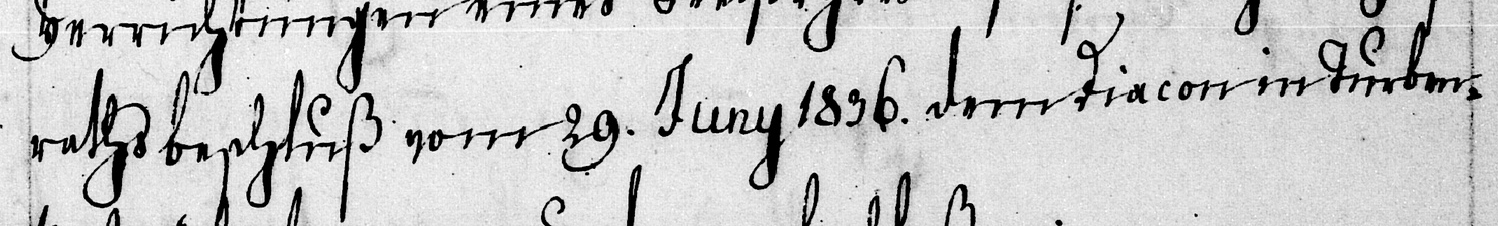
rathsbeschluß vom 29. Juny 1836. dem Diacon in Turben¬
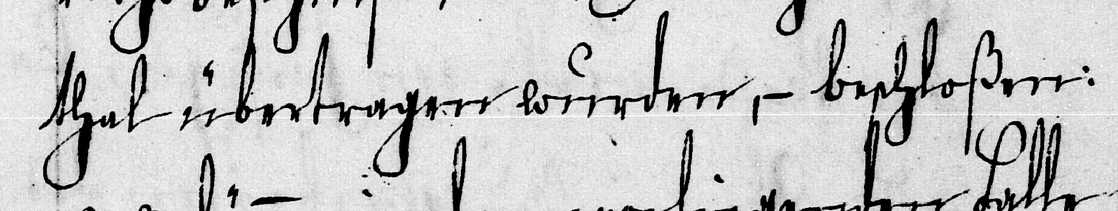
thal übertragen wurden, – beschloßen:
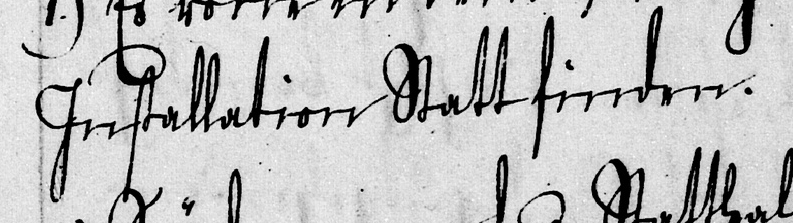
Installation Statt finden.
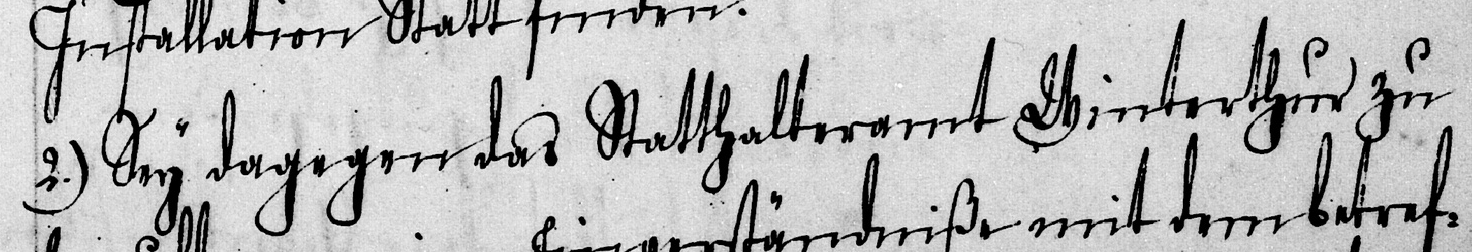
2.) Sey dagegen das Statthalteramt Winterthur zu
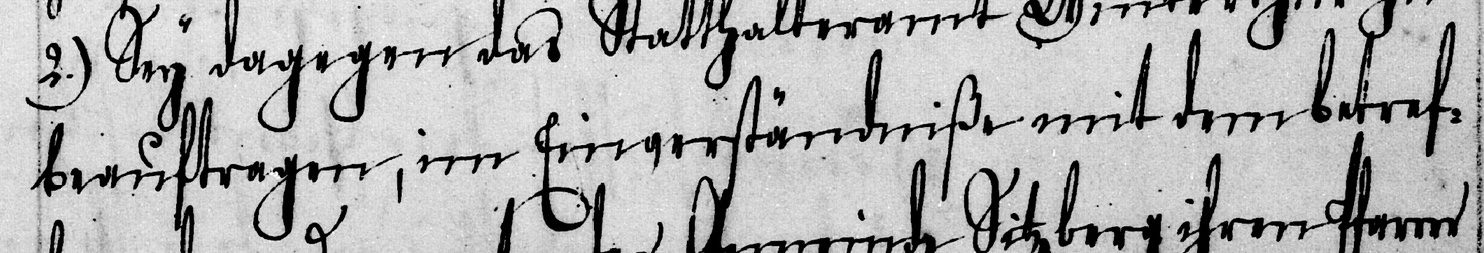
beauftragen, im Einverständniße mit dem betref¬
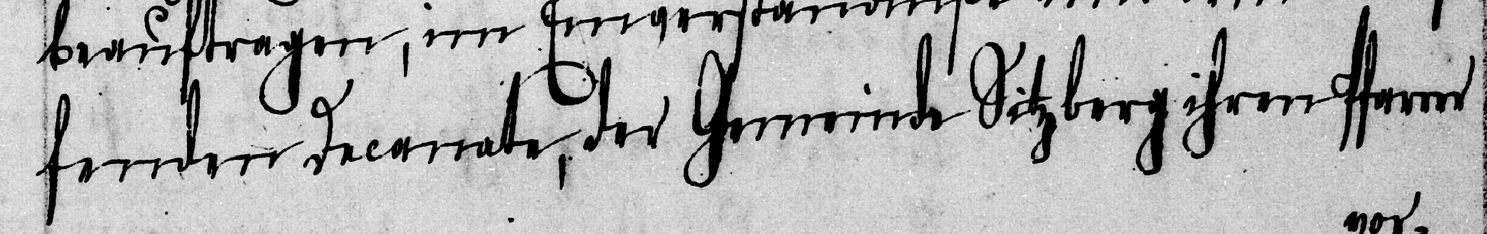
fenden Decanate, der Gemeinde Sitzberg ihren Pfar¬
